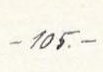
105
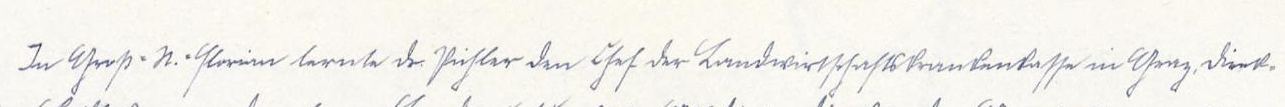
In Groß- St. Florian lernte Dr. Pichler den Chef der Landwirtschaftskrankenkasse in Graz, Direk-
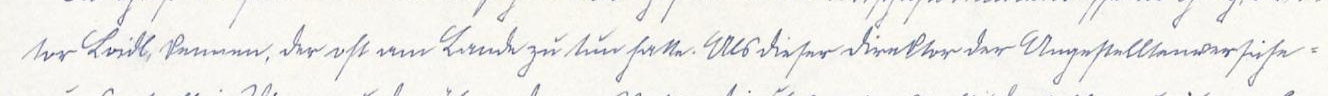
tor Loidl, kennen, der oft am Lande zu tun hatte. Als dieser Direktor der Angestelltenversiche-
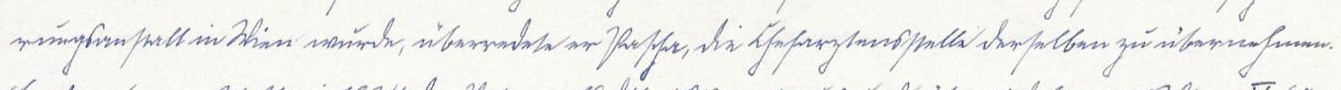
rungsanstalt in Wien wurde, überredete er Pascha, die Chefarztensstelle derselben zu übernehmen.
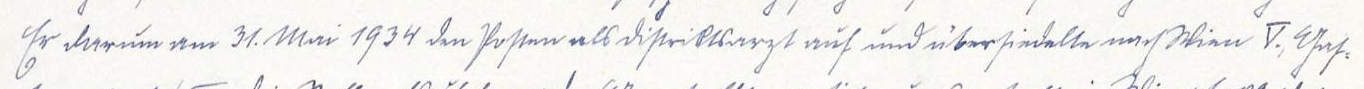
Er darum am 31. Mai 1934 den Posten als Distriktsarzt auf und übersiedelt nach Wien V.,Gas-
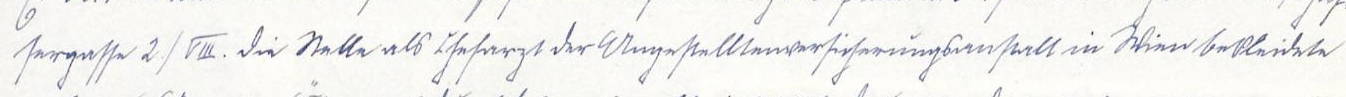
sergasse 2/VIII. Die Stelle als Chefarzt der Angestelltenversicherungsanstalt in Wien bekleidete
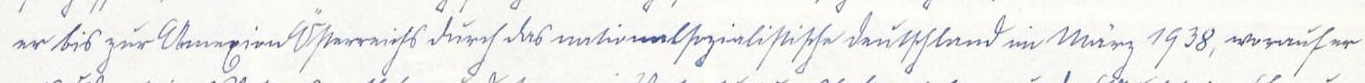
er bis zur Annexion Österreichs durch das Nationalsozialistische Deutschland in März 1938, worauf er
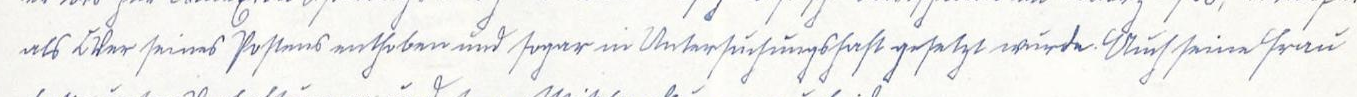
als CVer seines Posten enthoben und sogar in Untersuchungshaft gesetzt wurde. Auch seine Frau
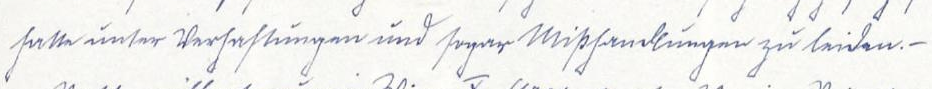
hatte unter Verhaftungen und sogar Mißhandlungen zu Leiden.
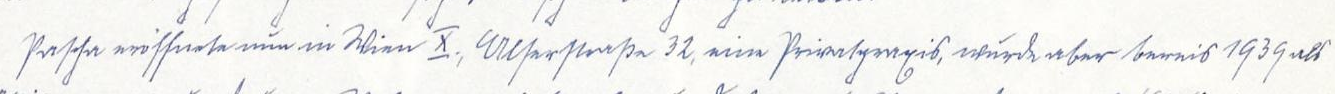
Pascha eröffnete nun in Wien X, Alserstraße 32, eine Privatprapis, wurde aber bereits 1939 als
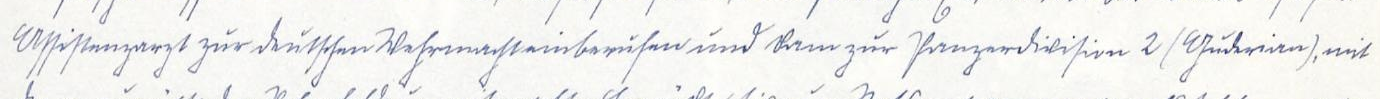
Assistenzarzt zur deutschen Wehrmacht einberufen und kam zur Panzerdivision 2 (Guderian), mit
